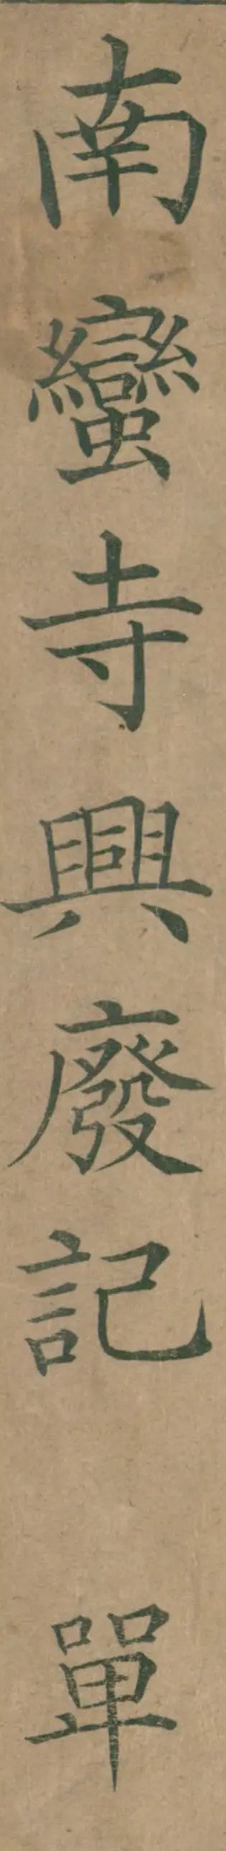南蛮寺興廃記単

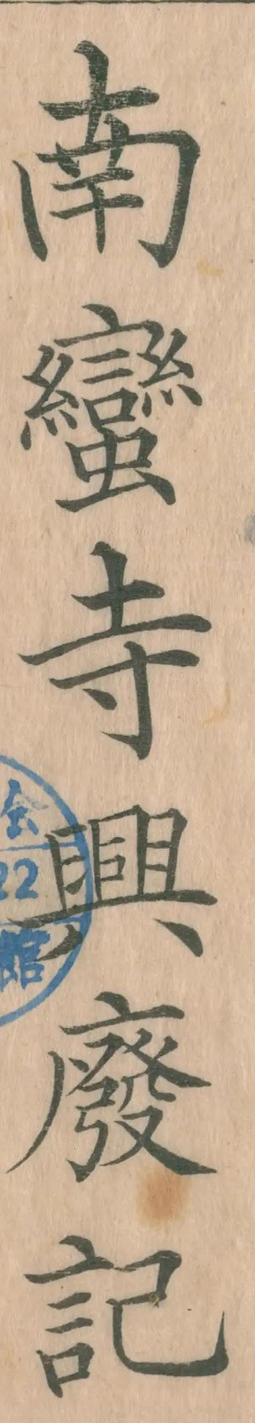南蛮寺興廃記
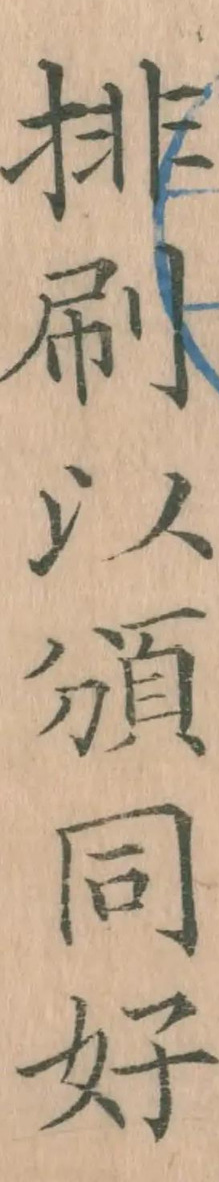排刷以頒同好
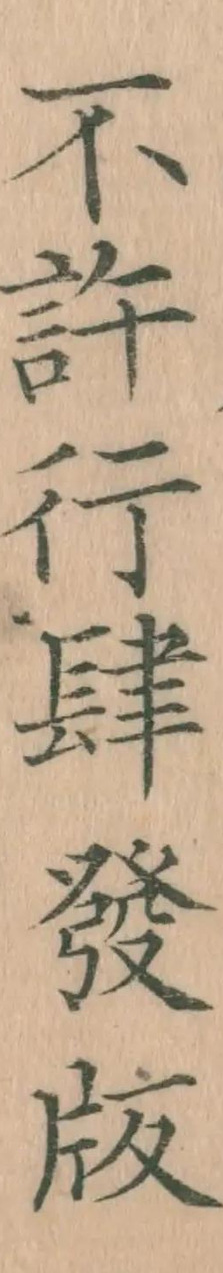不許行肆発版

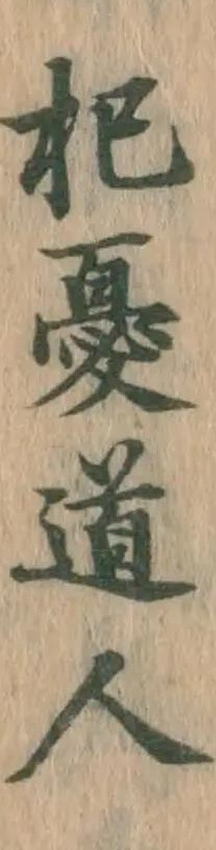杞憂道人
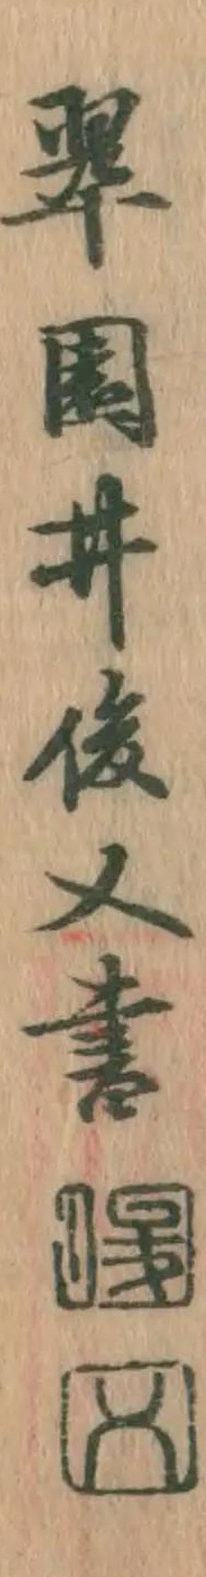翠園井俊文書
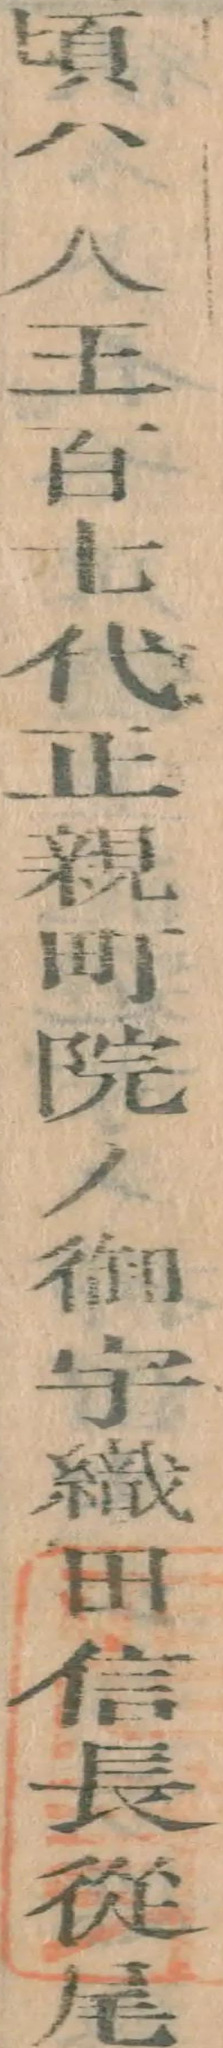頃ハ人王百七代正親町院ノ御宇織田信長従尾
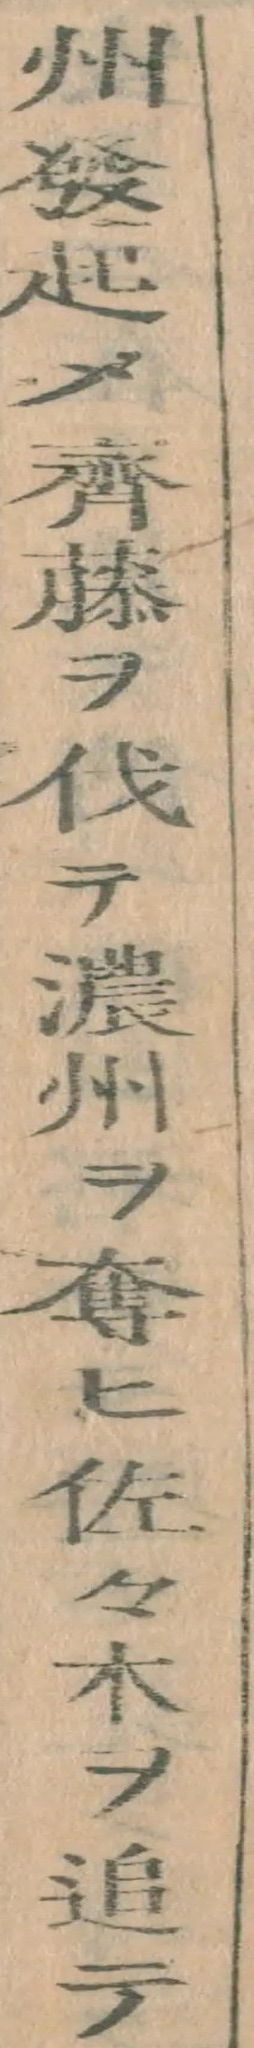州発起シテ斉藤ヲ伐テ濃州ヲ奪ヒ佐々木ヲ追テ
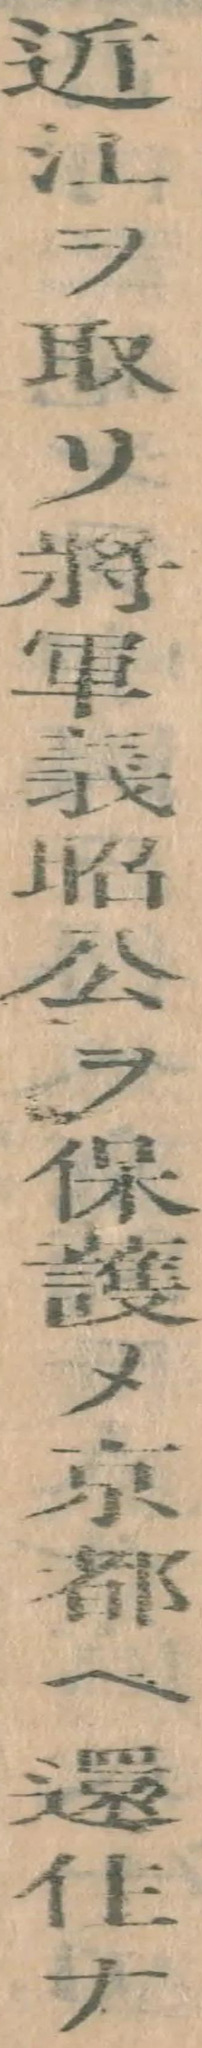近江ヲ取リ将軍義昭公ヲ保護シテ京都ヘ還住ナ
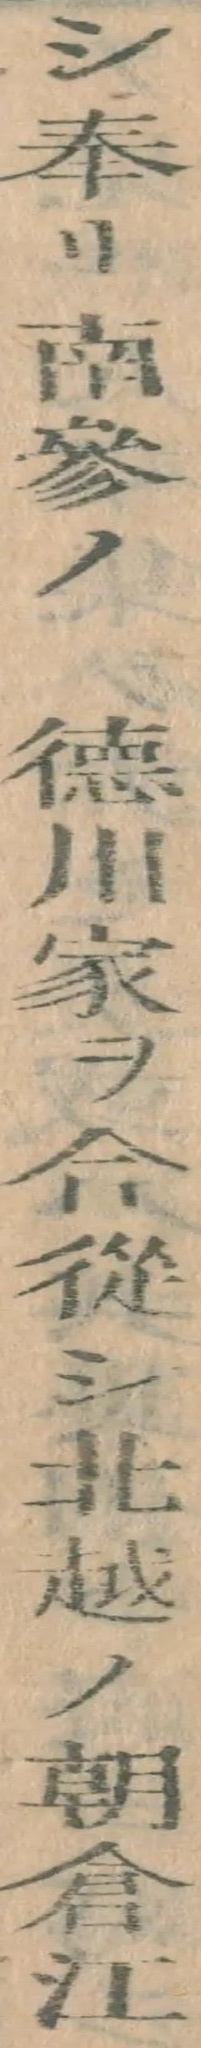シ奉リ南参ノ德川家ヲ合従シ北越ノ朝倉江
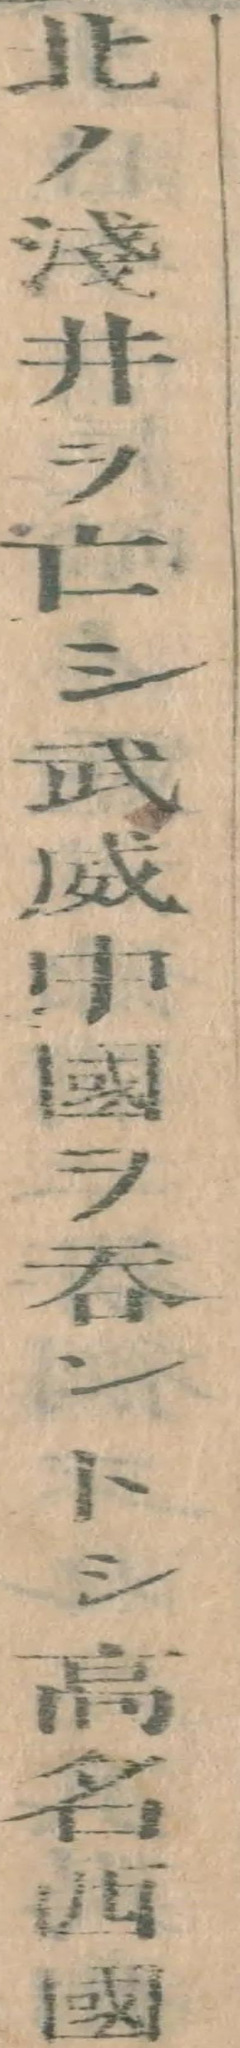北ノ浅井ヲ亡シ武威中国ヲ呑ントシ高名西国
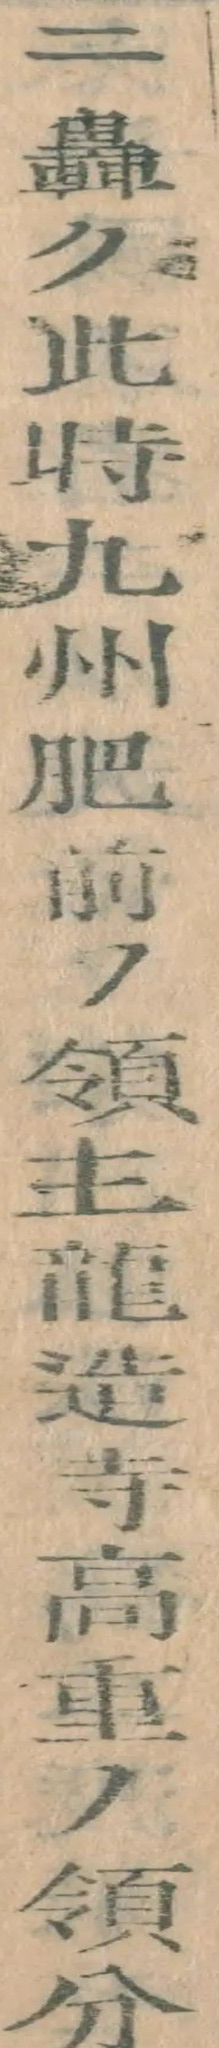ニ轟ク此時九州肥前ノ領主竜造寺高重ノ領分
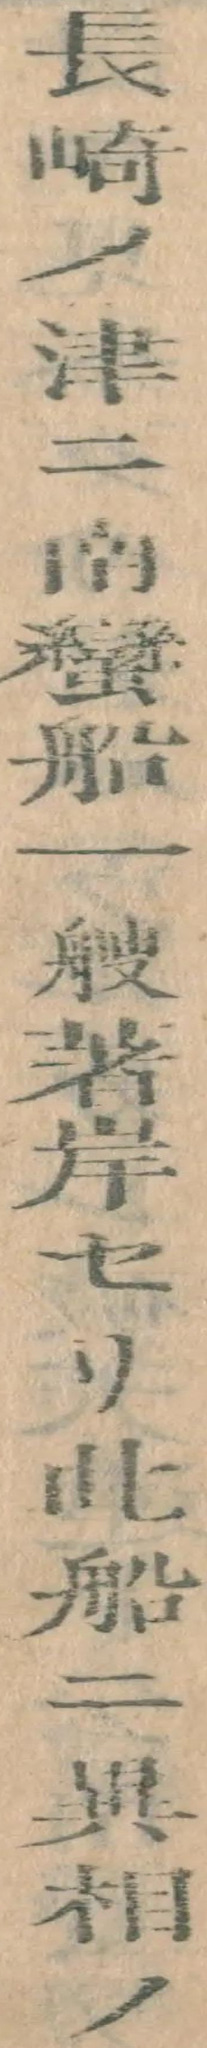長崎ノ津ニ南蛮船一艘著岸セリ此船ニ異相ノ
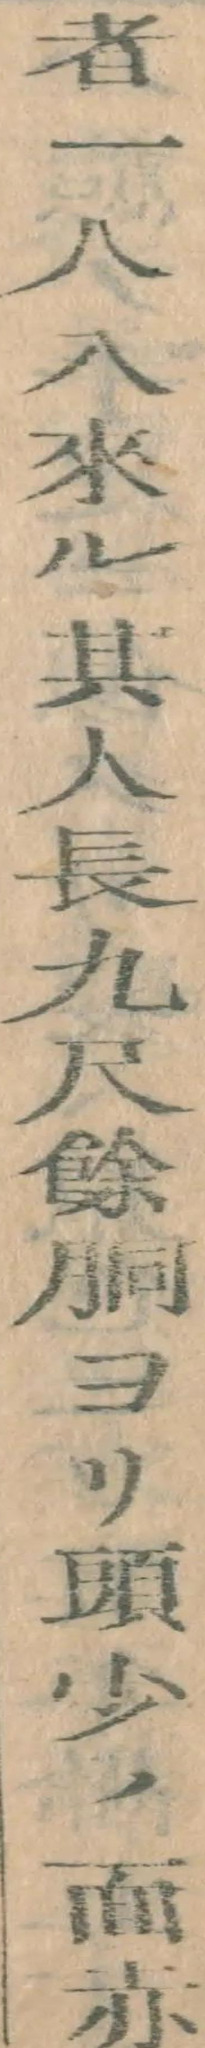者一人入来ル其人長九尺余胴ヨリ頭少ノ面赤
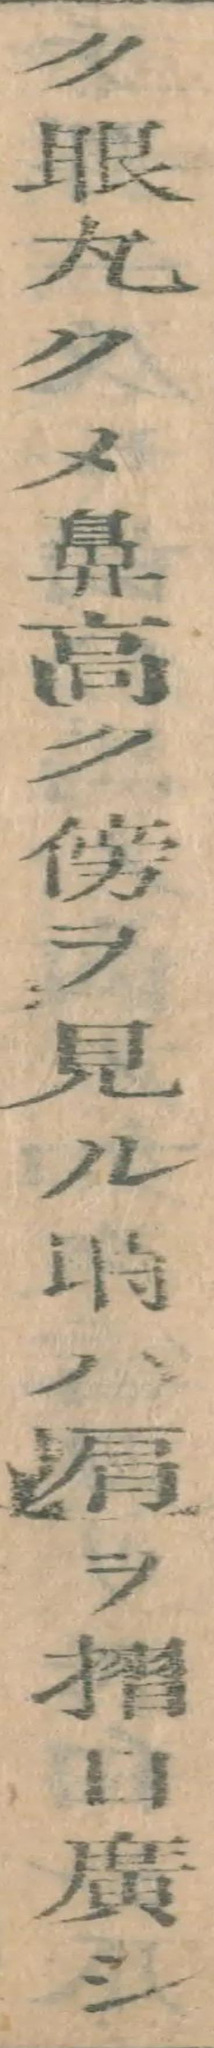ク眼丸クシテ鼻高ク傍ヲ見ル時ハ肩ヲ摺口広シ

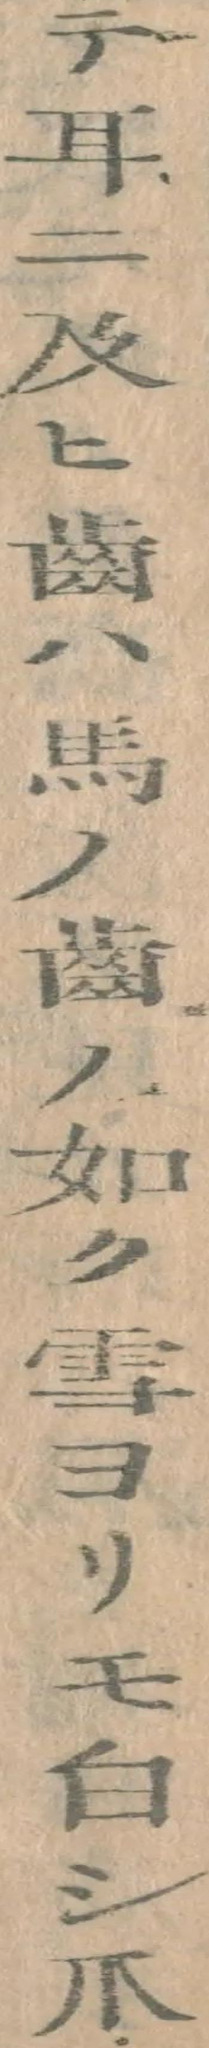テ耳ニ及ヒ歯ハ馬ノ歯ノ如ク雪ヨリモ白シ爪
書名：南蛮寺興廃記
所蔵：国立国会図書館 National Diet Library, JAPAN
